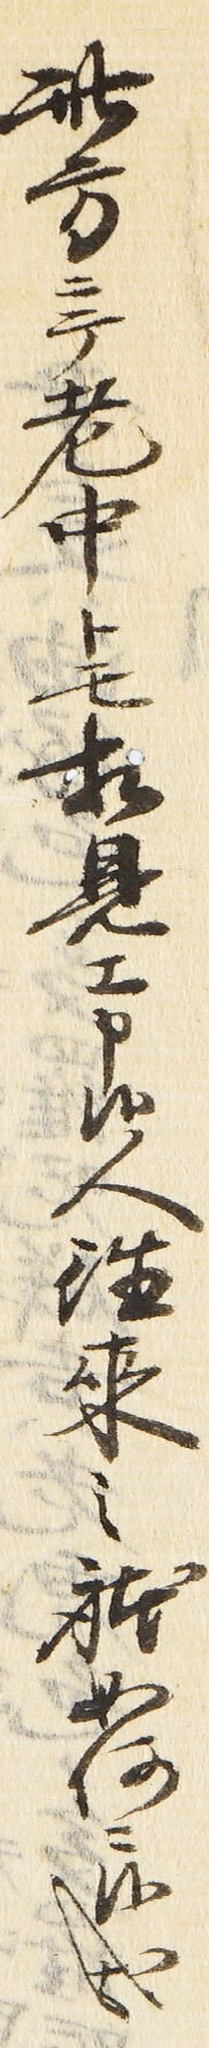此方にて老中とも相見え申候人往来之体如何に候哉
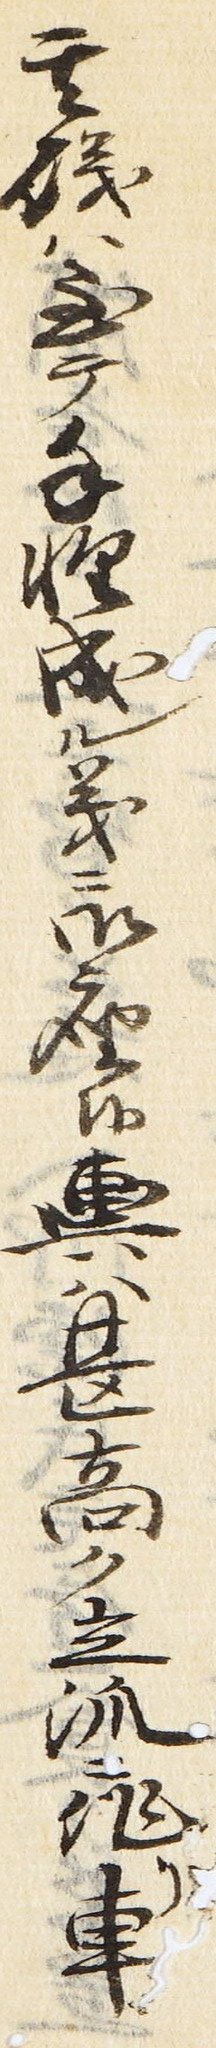其儀は至て手軽成る義に御座候輿は甚高く立派に作り車
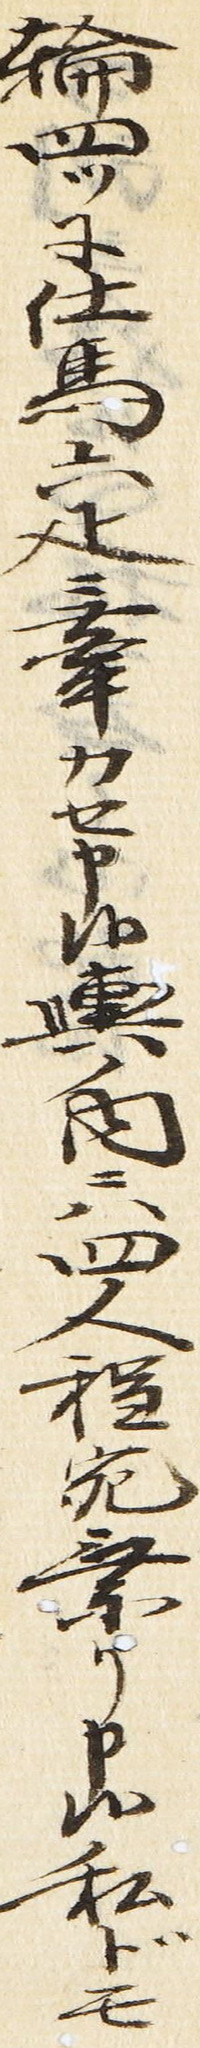輪四つに仕馬六疋に牽かせ申候輿の内には四人程宛乗り申候私ども
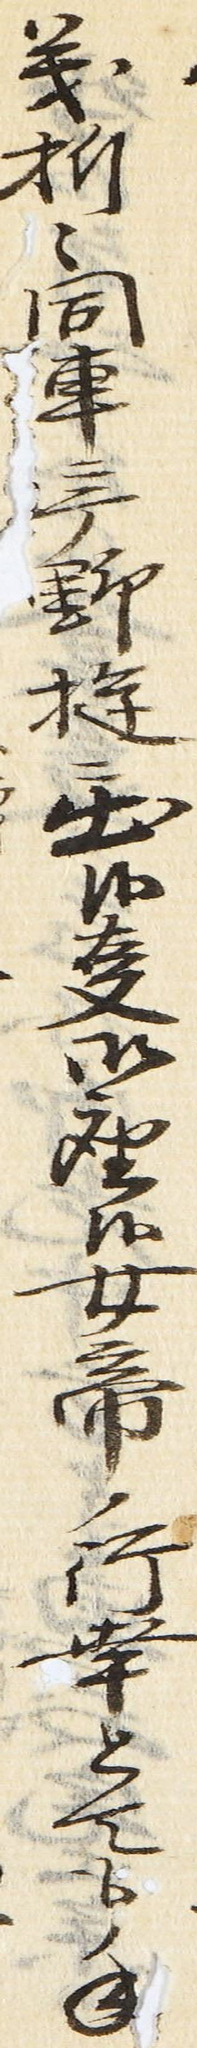義折々同車にて野遊に出候事御座候女帝の行幸とても手
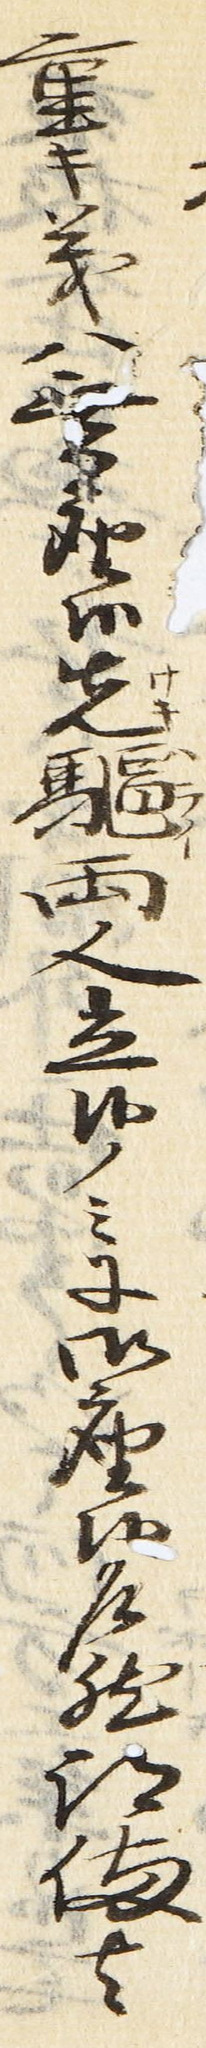重き義は無御座候先駆両人立候のみに御座候乍然跡𠈓は
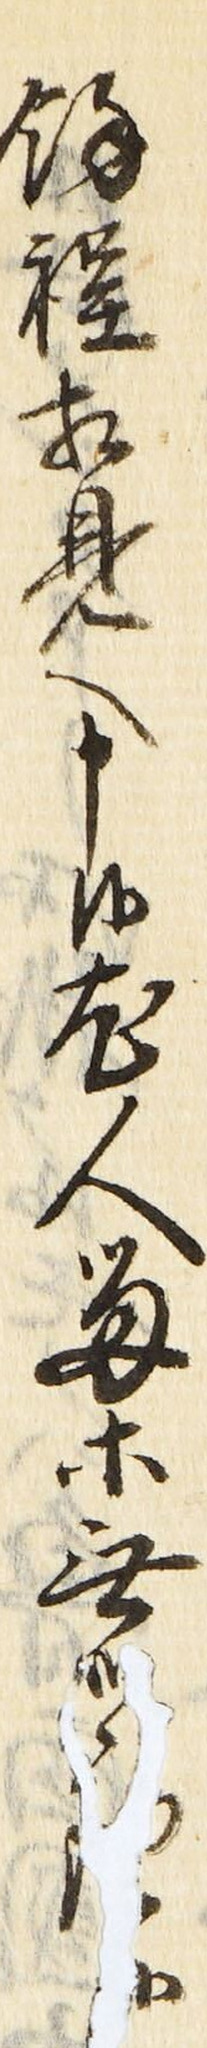余程相見へ申候尤人留等無御座候
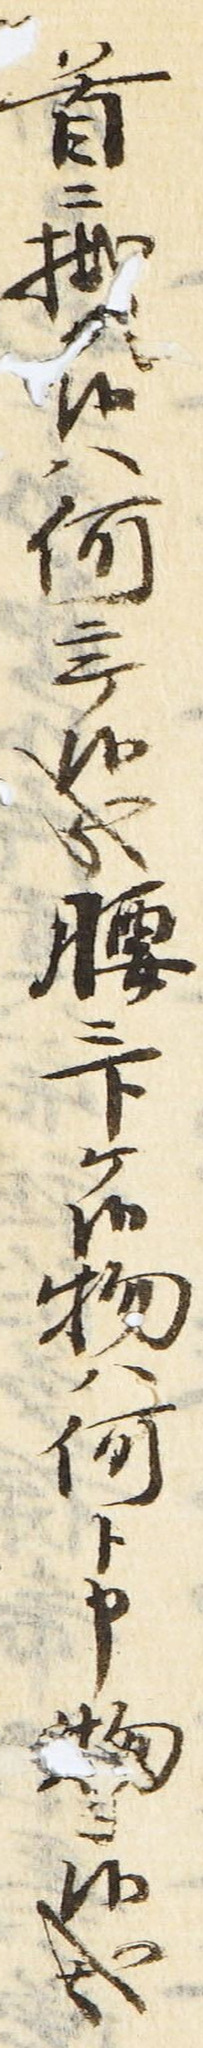首に掛候は何にて候哉腰に下け候物は何と申物に候哉

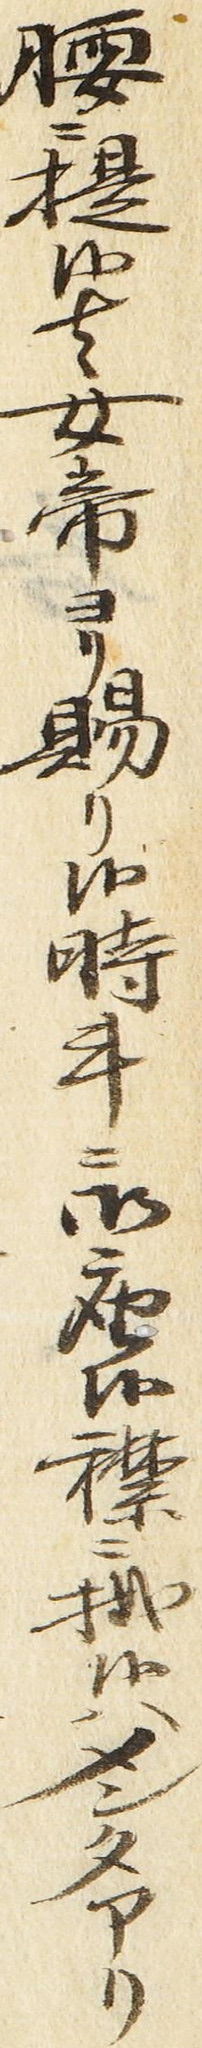腰に提候は女帝より賜り候時計に御座候襟に掛候はメンタアリ
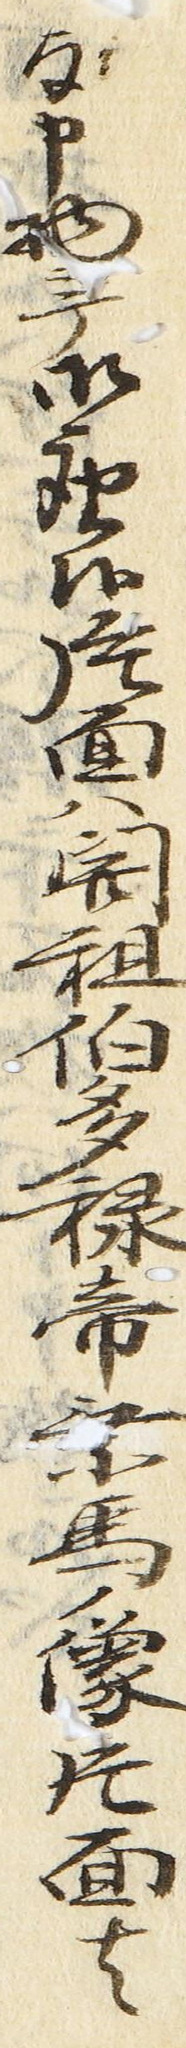と申物にて御座候片面は開祖伯多禄帝乗馬の像片面は
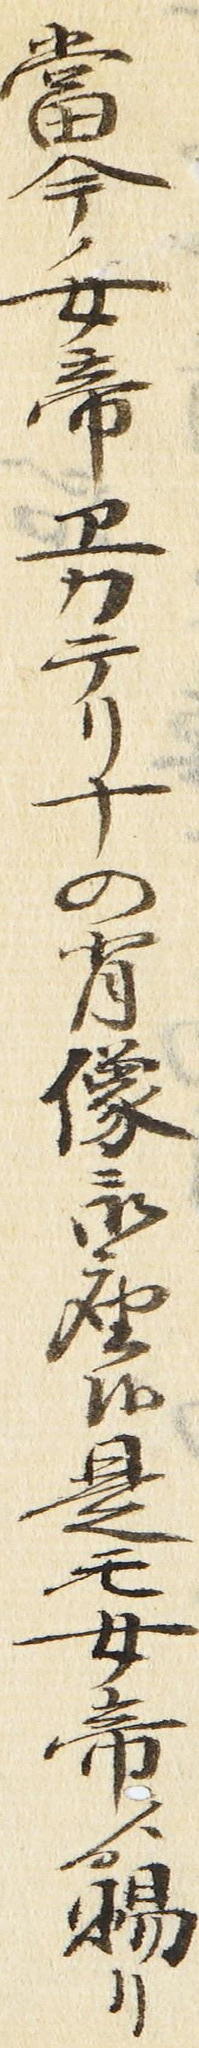当今の女帝エカテリナの肖像に御座候是も女帝ゟ賜り
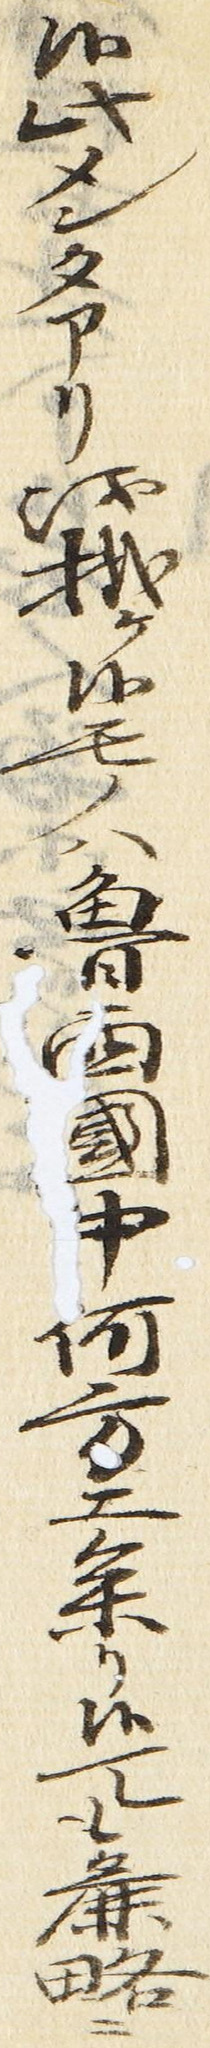候此メンタアリを掛け候ものは魯西亜国中何方え参り候ても麁略に
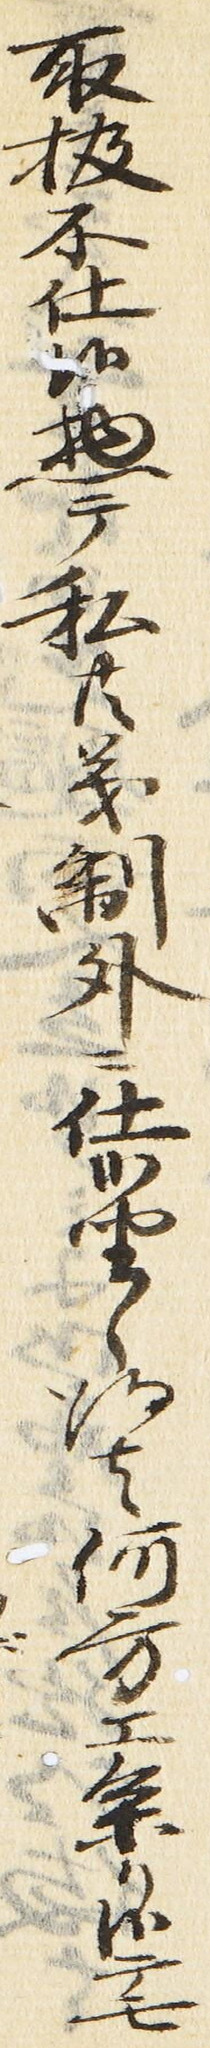取扱不仕候惣て私共義制外に仕御座候得は何方え参り候ても
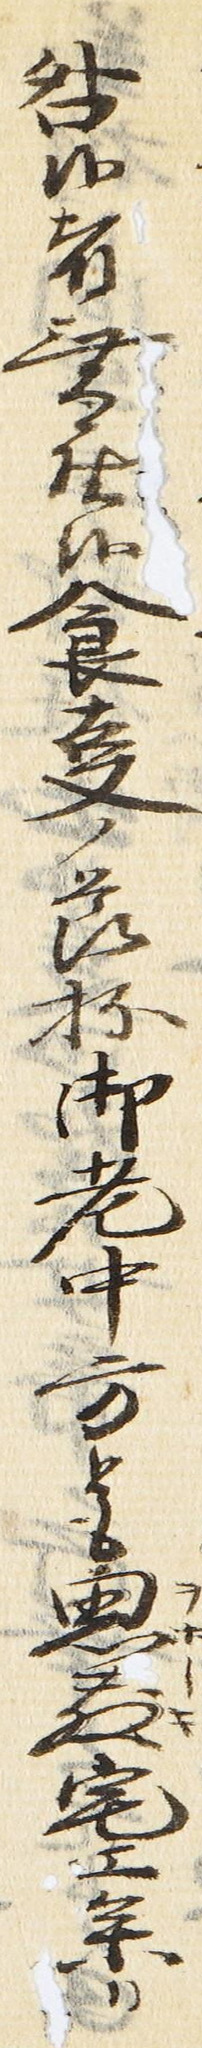咎候旨無御座候食事の節抔御老中方とも思敷宅え参り
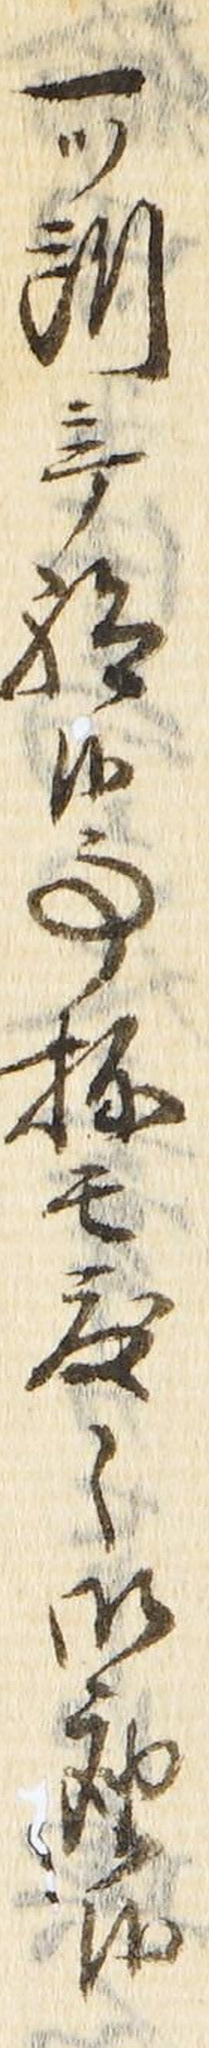一ツ所にて給候事抔も度々御座候
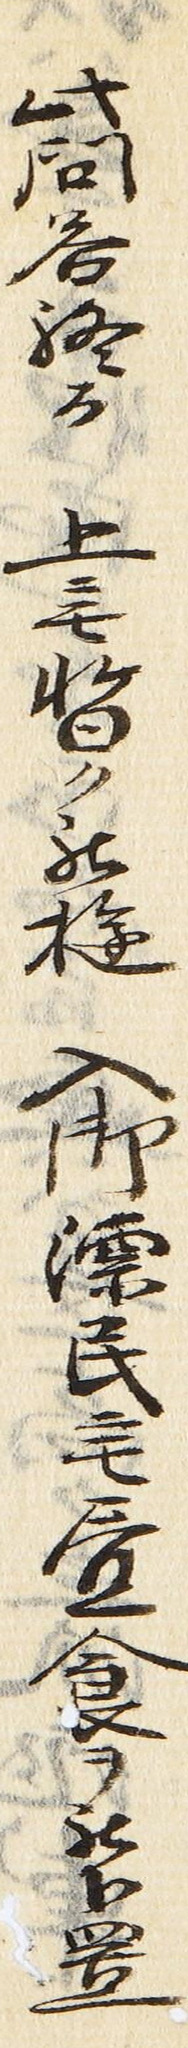此問答終て上にも暫く被遊入御漂民にも昼食を被下置
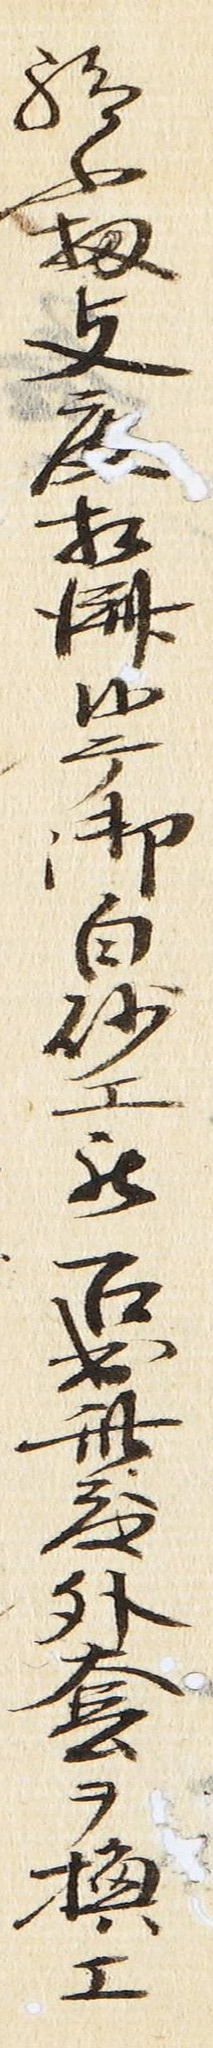給ふ扨支度相済候て御白砂え被召出此度外套を換え
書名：神昌丸漂流問答
